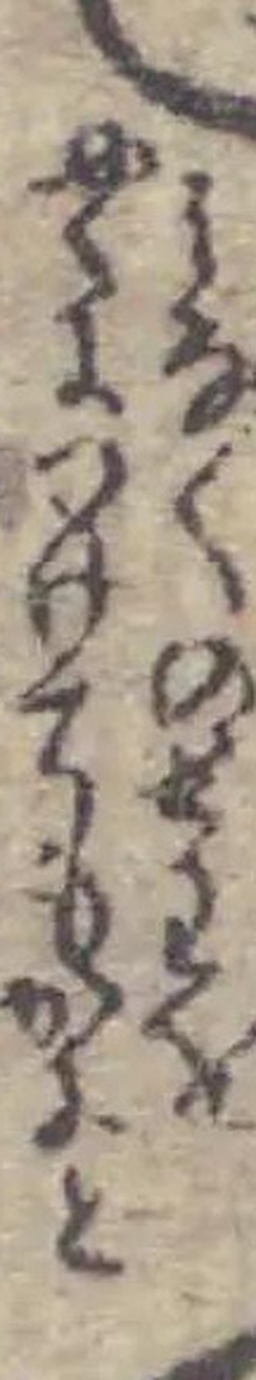やくにつけてもかにと
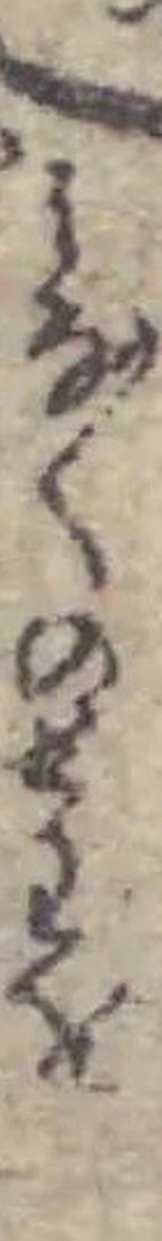みな〳〵のせわを
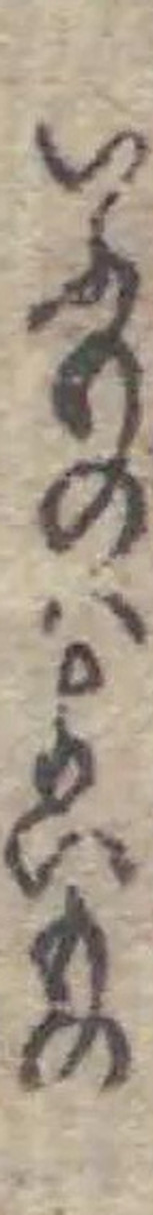いふものはよいもの

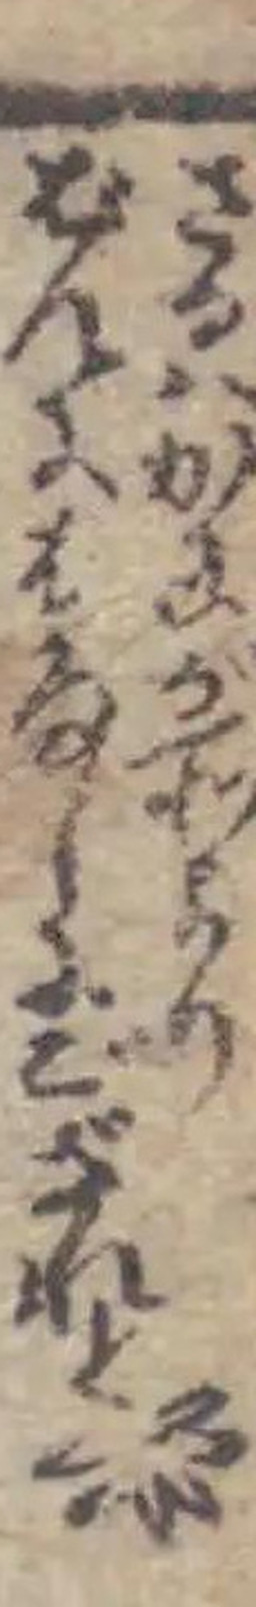ばんにはなしにござれと
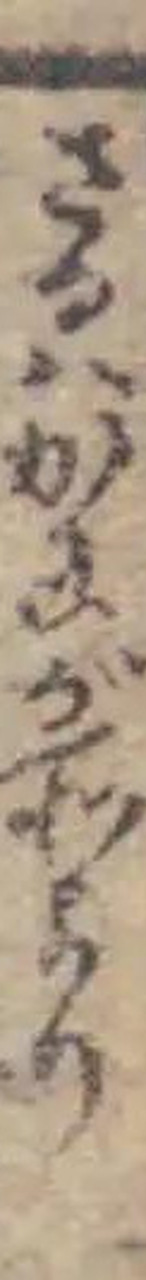さるはかにが所より
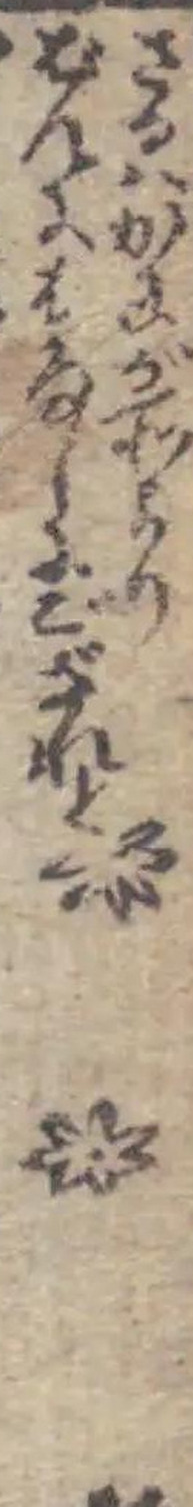ばんにはなしにござれと
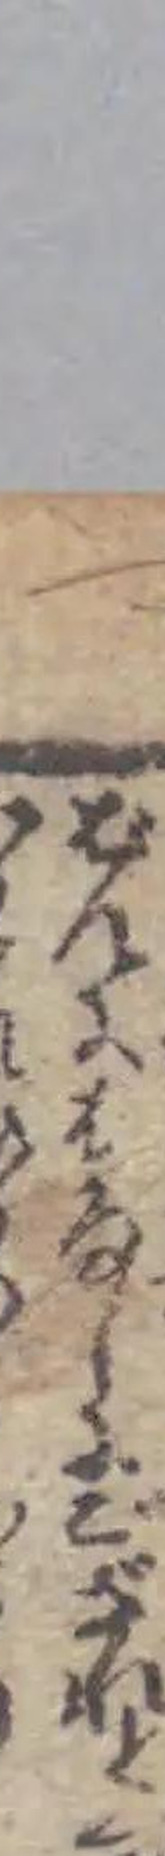ばんにはなしにござれと
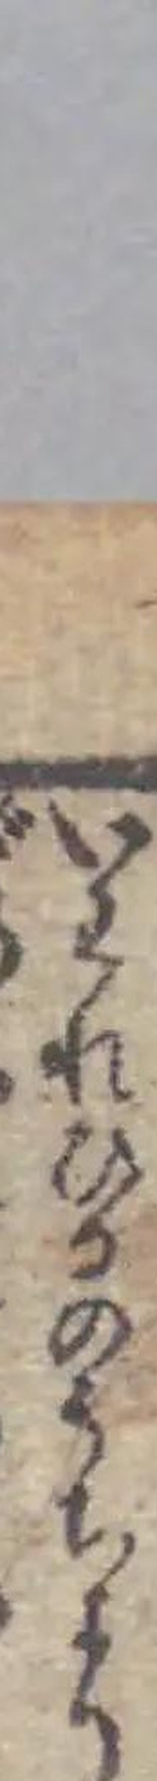いわれひるのうちより
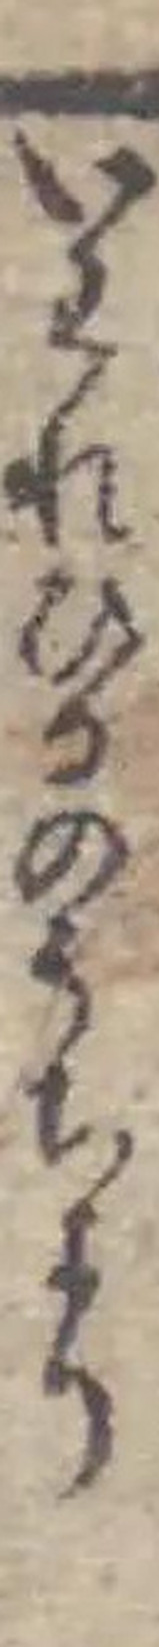いわれひるのうちより
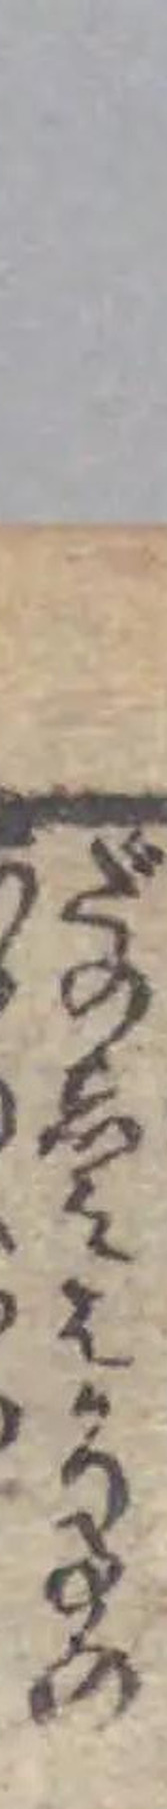だのしみはかり事の
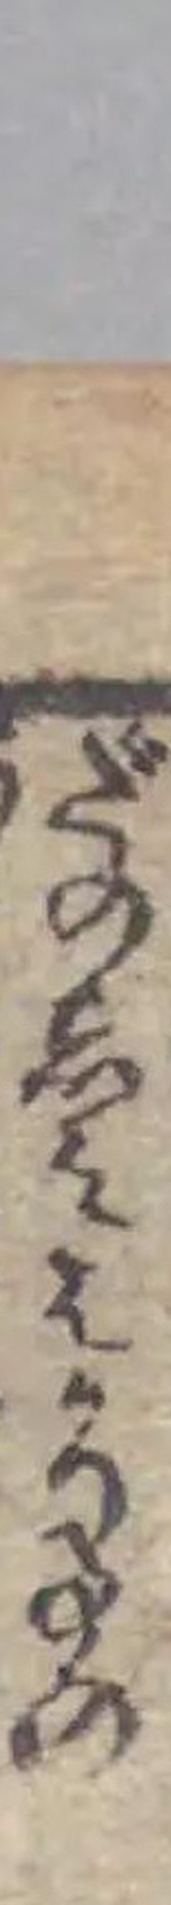だのしみはかり事の
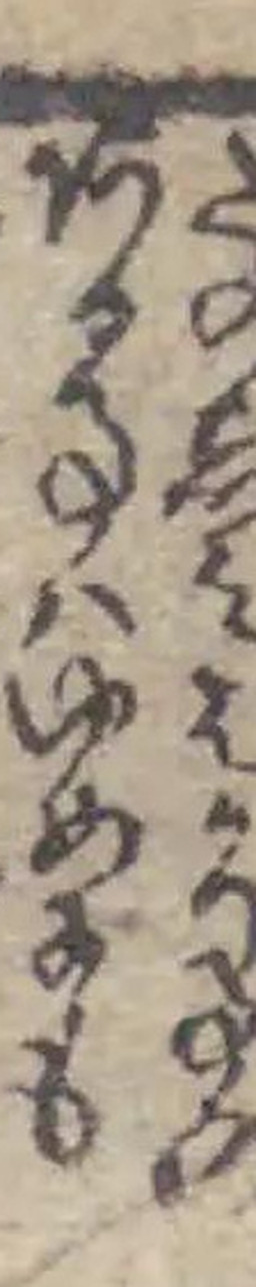ある事はゆめにも
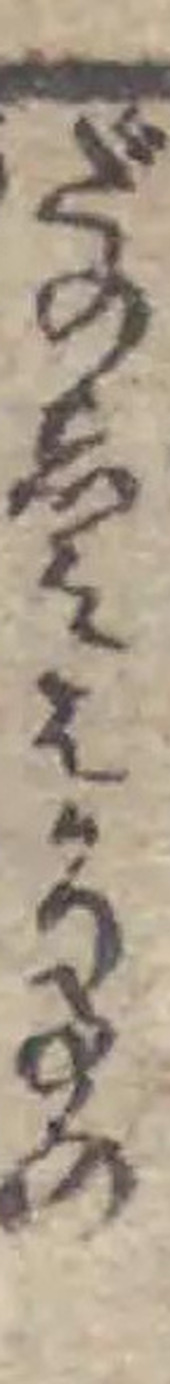だのしみはかり事の
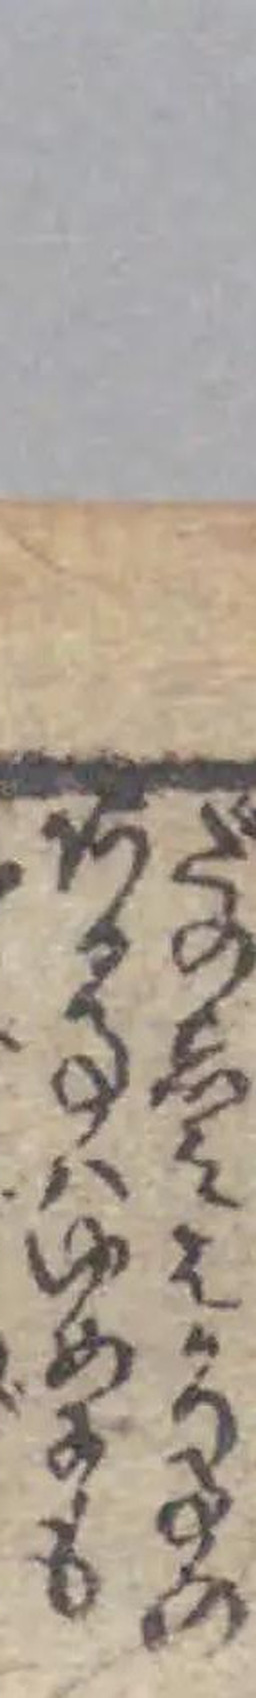ある事はゆめにも
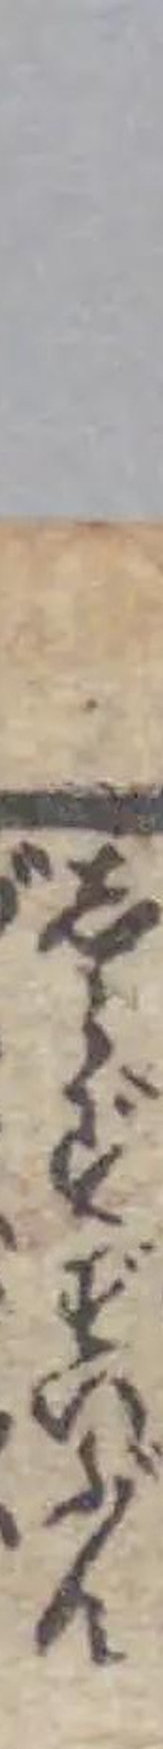しらずずいぶん
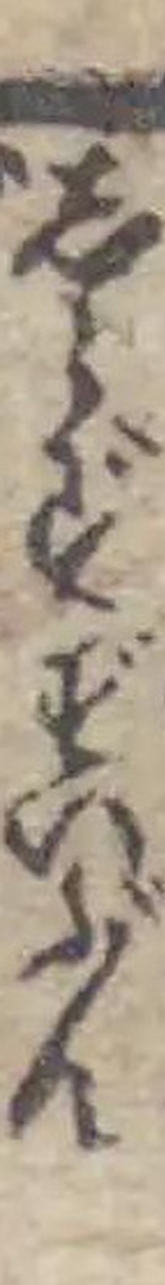しらずずいぶん
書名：蟹牛房挟多 3巻
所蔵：国立国会図書館 National Diet Library, JAPAN
